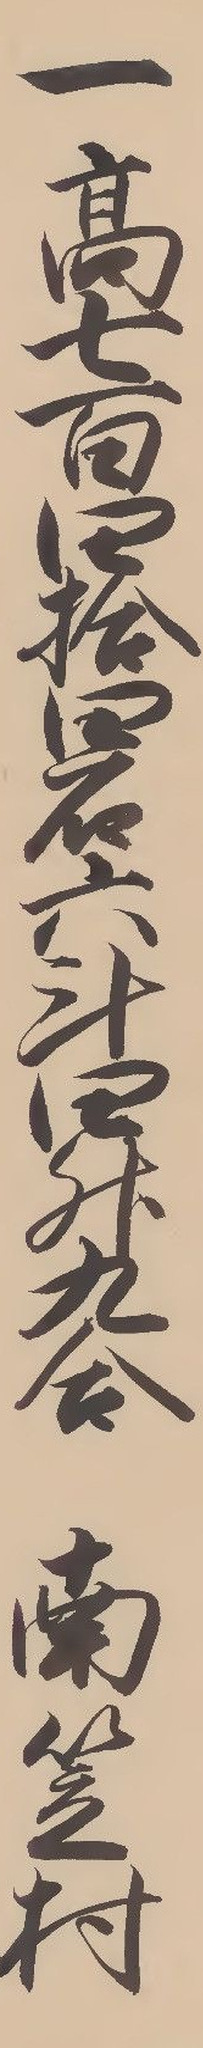一高七百四拾四石六斗四升九合南笠村
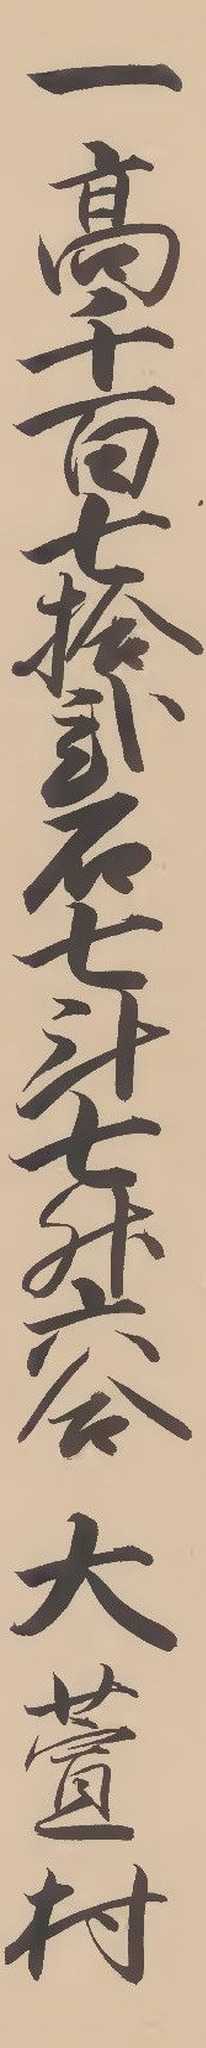一高千百七拾弐石七斗七升六合大萱村
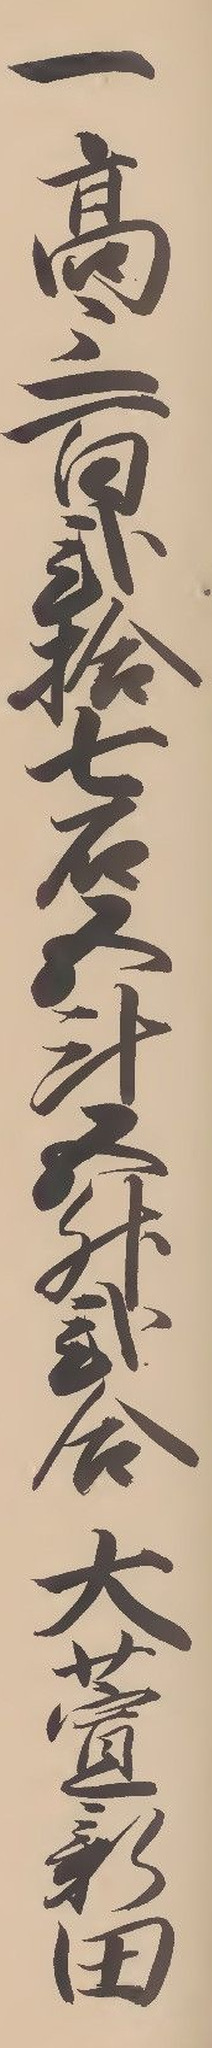一高三百弐拾七石五斗五升弐合大萱新田
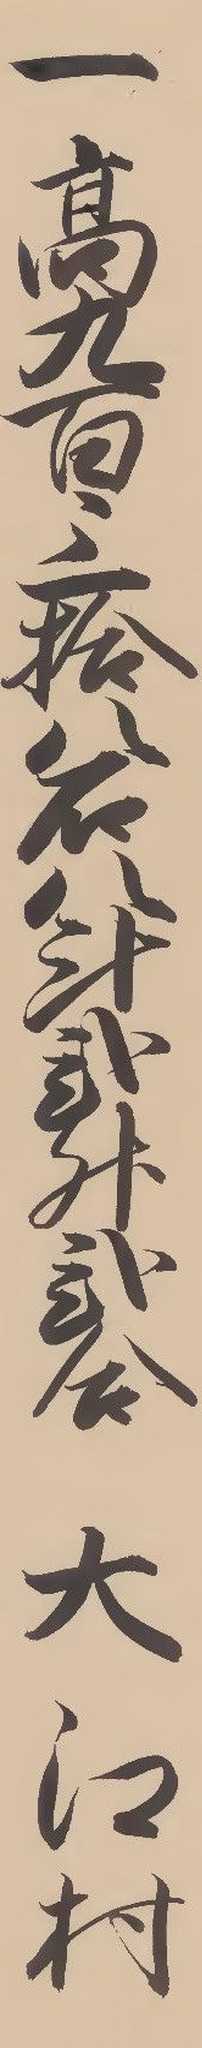一高九百三拾八石八斗弐升弐合大江村
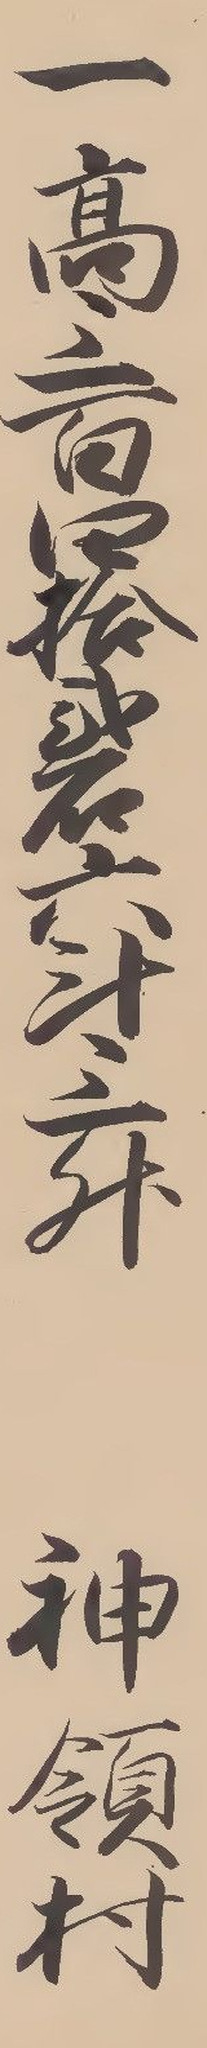一高三百四拾弐石六斗三升神領村
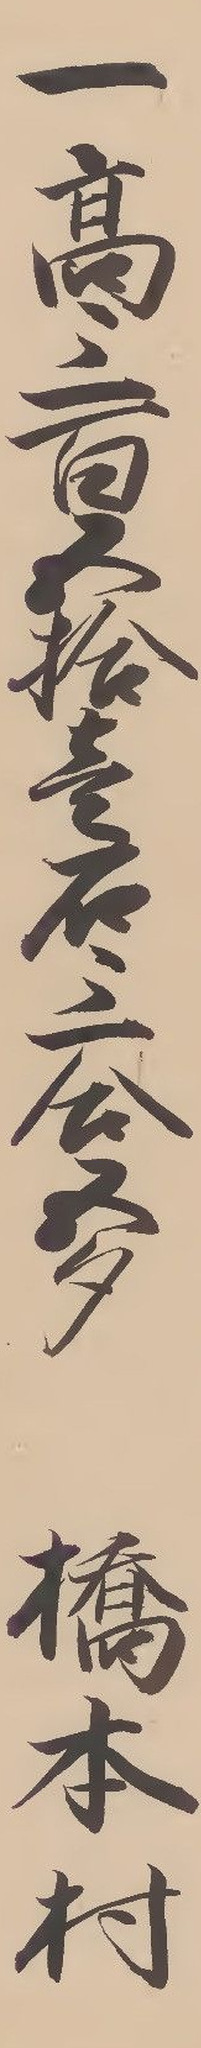一高三百五拾壱石三合五勺橋本村

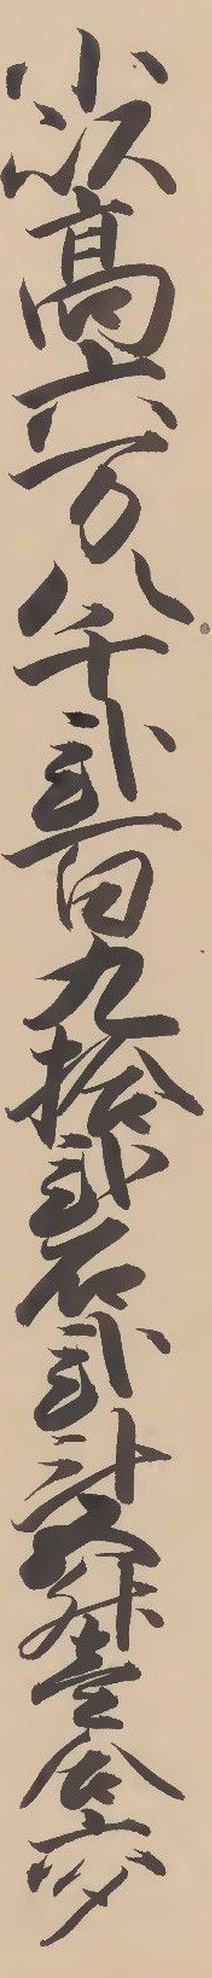小以高六万八千弐百九拾弐石弐斗五升壱合六勺
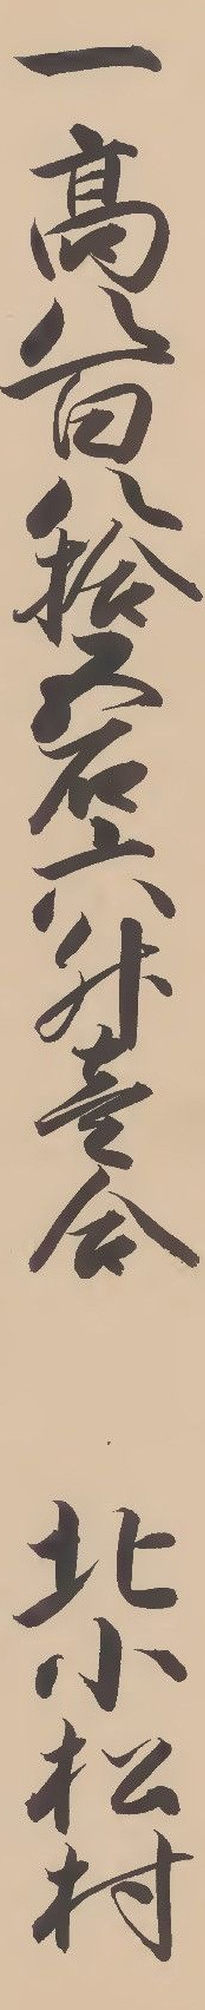一高八百八拾五石六升壱合北小松村
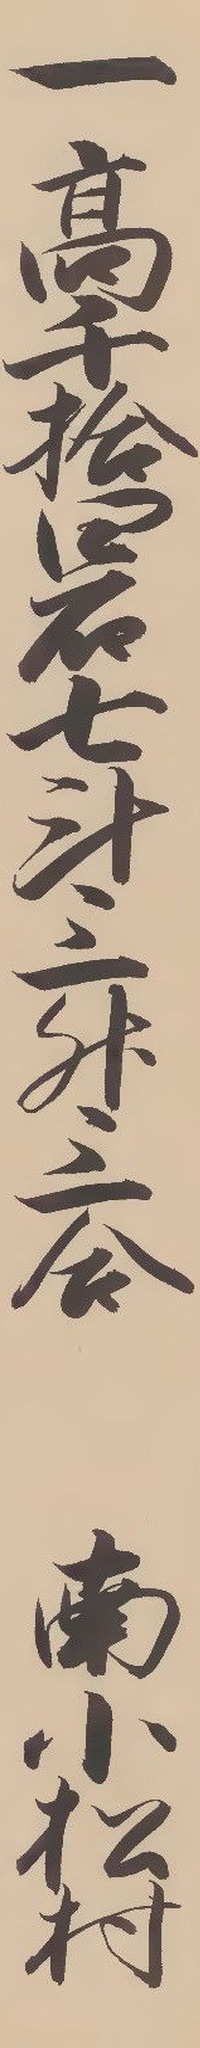一高千拾四石七斗三升三合南小松村
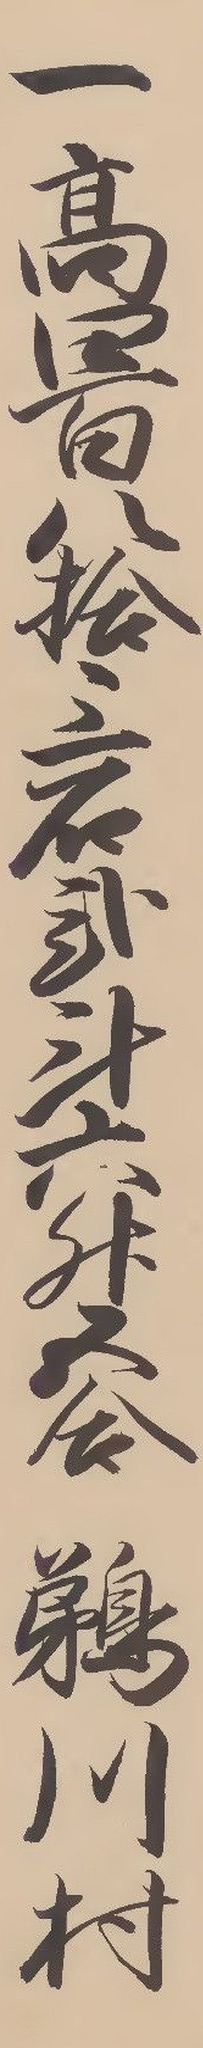一高四百八拾三石弐斗六升五合鵜川村

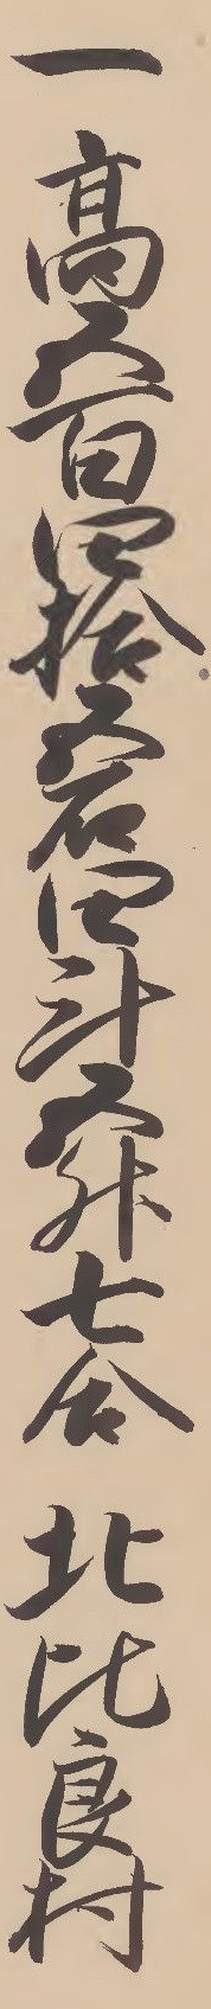一高五百四拾五石四斗五升七合北比良村
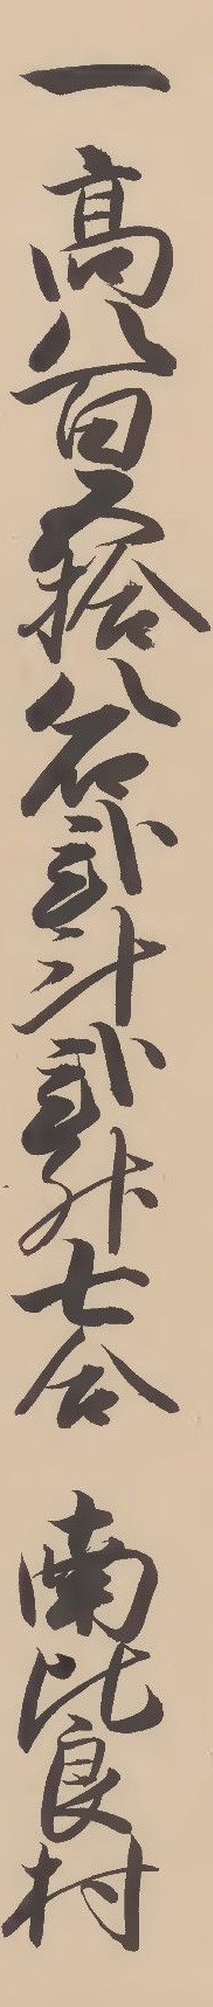一高八百五拾八石弐斗弐升七合南比良村
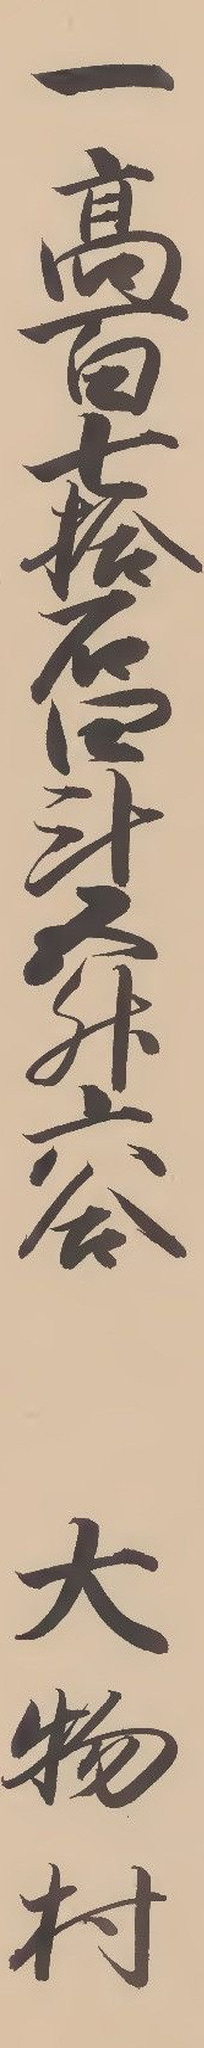一高百七拾石四斗五升六合大物村
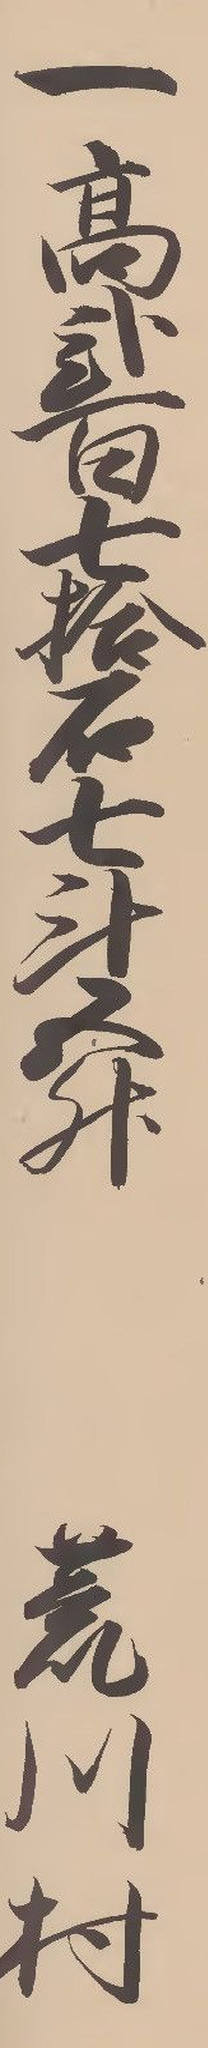一高弐百七拾石七斗五升荒川村
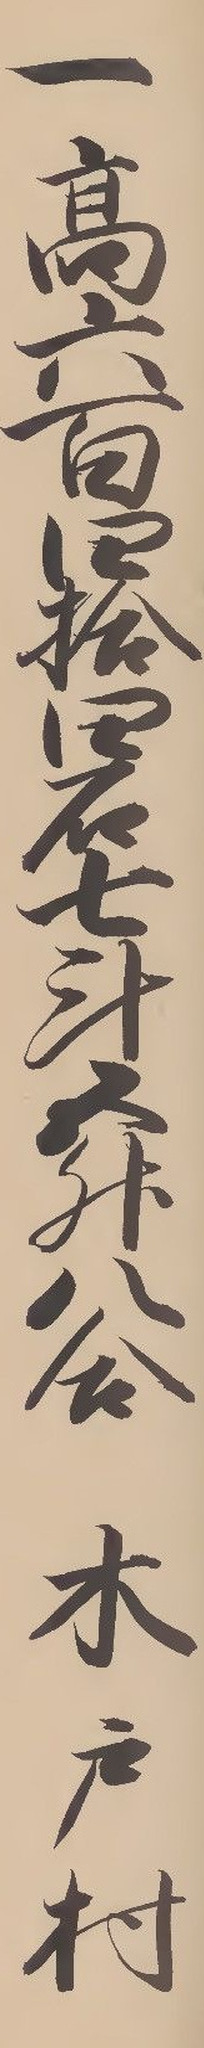一高六百四拾四石七斗五升八合木戸村
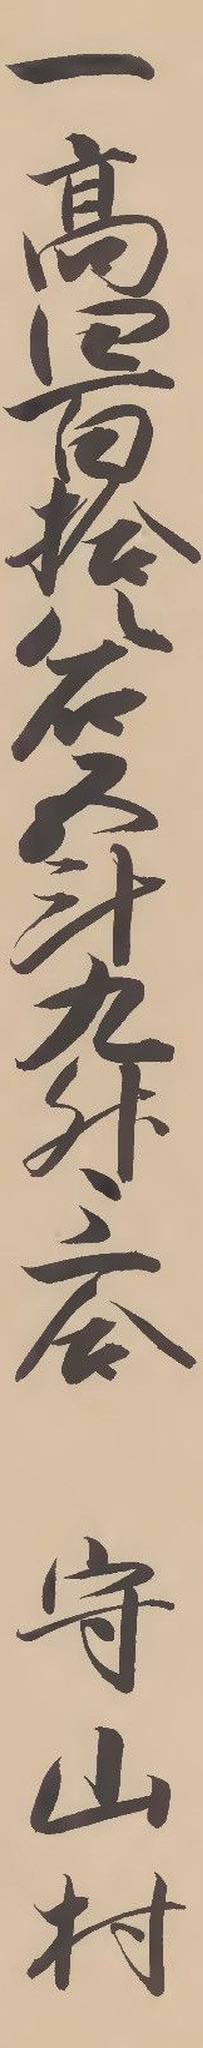一高四百拾八石五斗九升三合守山村
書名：近江国郷帳
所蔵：国立公文書館 National Archives of Japan
